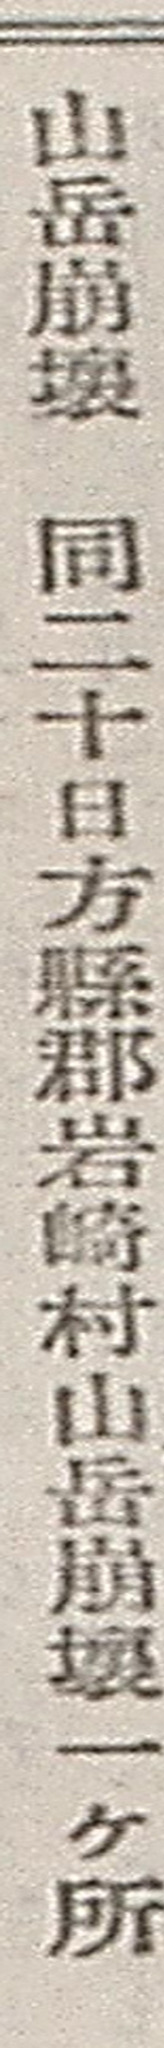山岳崩壊同二十日方縣郡岩崎村山岳崩壊一ヶ所
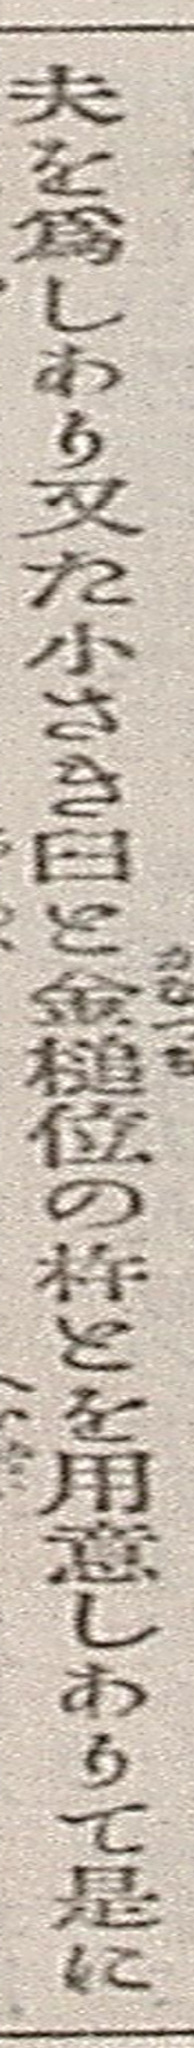夫を為しあり又た小さき𦥑と金槌位の杵とを用意しありて是に
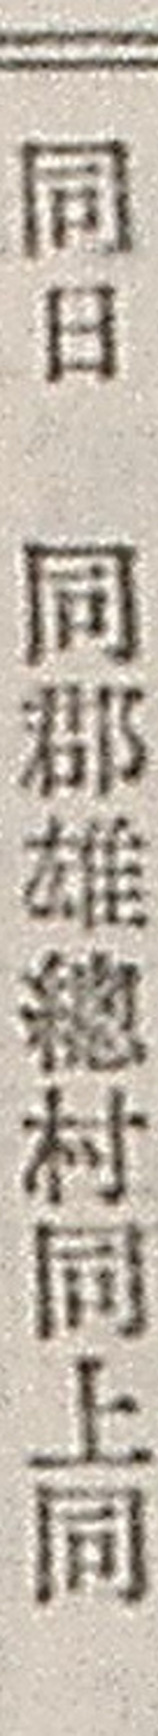同日同郡雄総村同上同
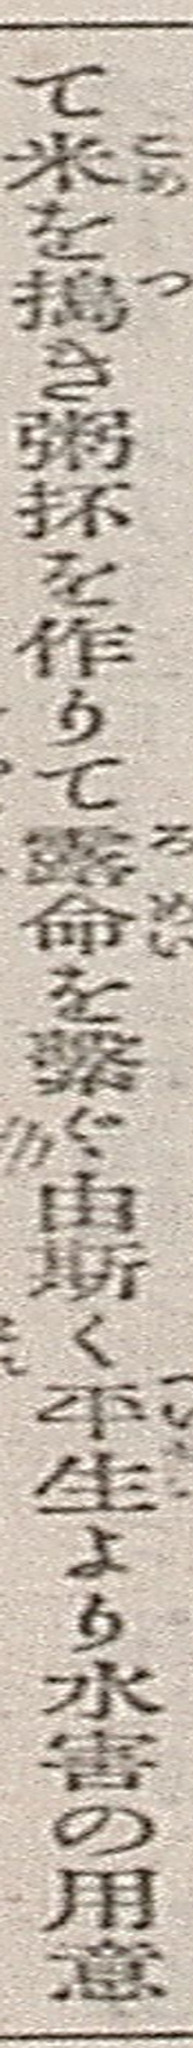て米を搗き粥坏を作りて露命を繋ぐ由斯く平生よりすいがいの用意
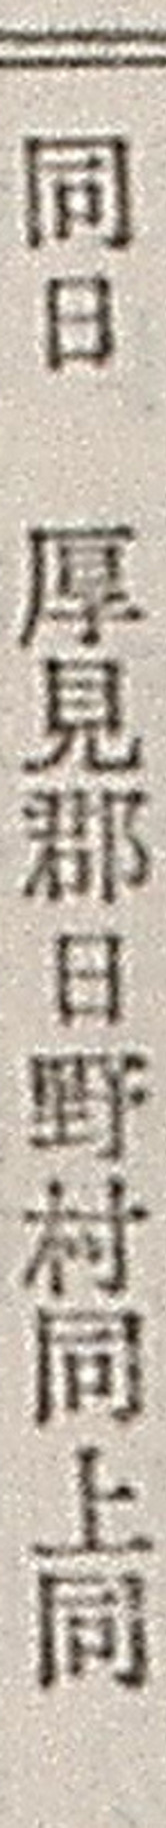同日厚見郡日野村同上同
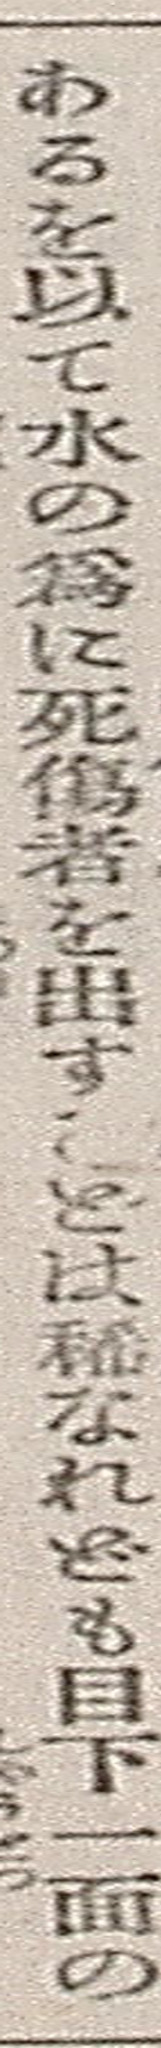あるを以て水の為に死傷者を出すことは稀なれども目下一面の
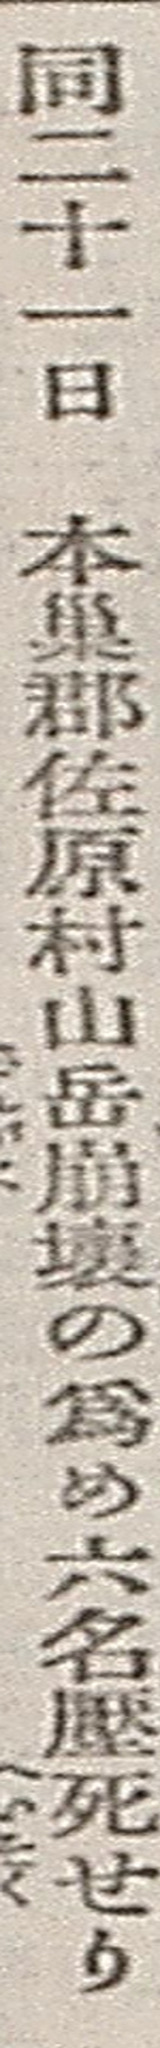同二十一日本巣郡佐原村山岳崩壊の為め六名圧死せり
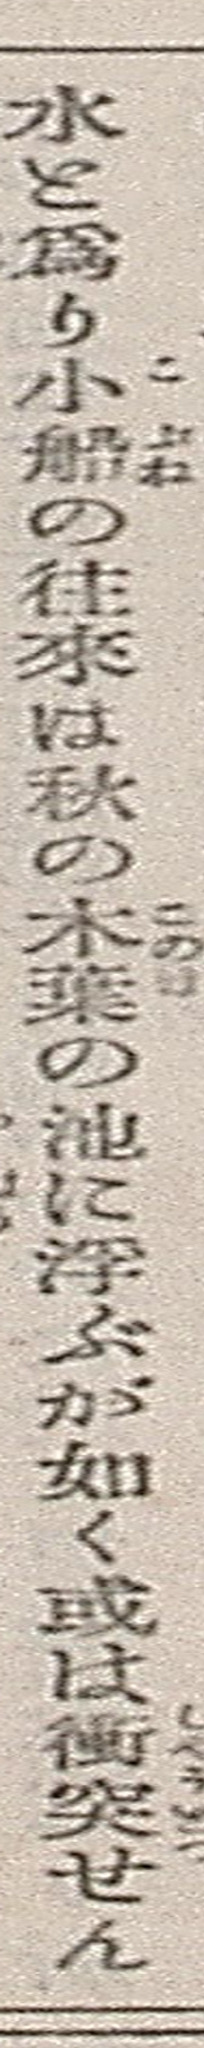水と為り小舟の往来は秋の木葉の池に浮ぶが如く或は衝突せん
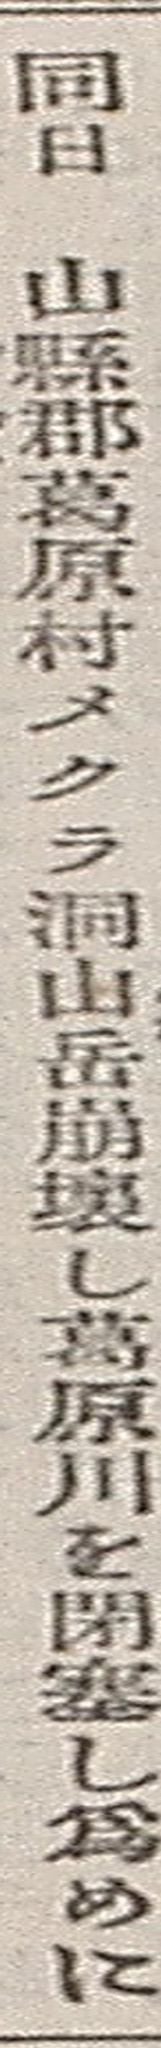同日山縣郡葛原村メクラ洞山岳崩壊し葛原川を閉塞し為めに
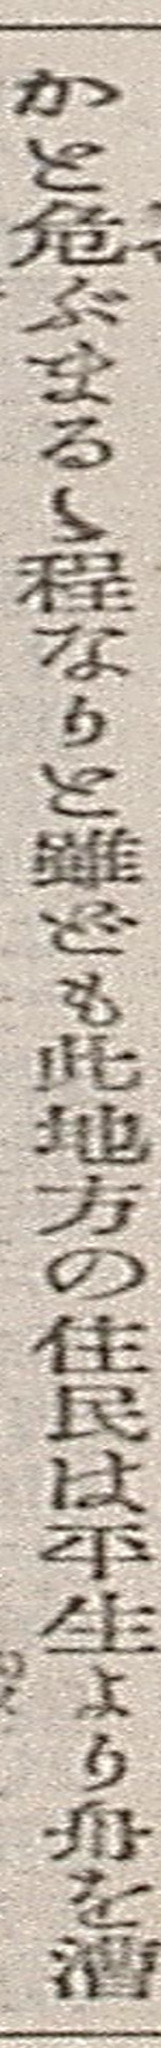かと危ぶまるゝ程なりと雖も此地方の住民は平生より舟を漕
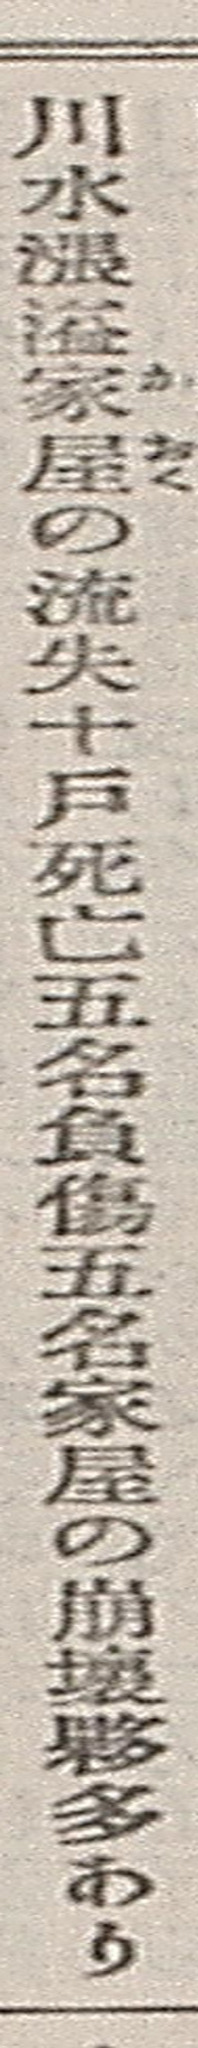川水漲溢家屋の流失十戸死亡五名負傷五名家屋の崩壊夥多あり
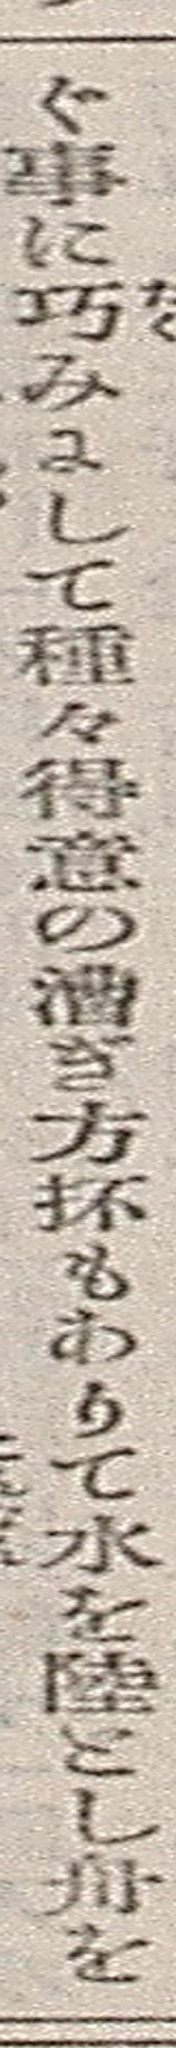ぐ事に巧みにして種々得意の漕ぎ方抔もありて水を陸とし舟を
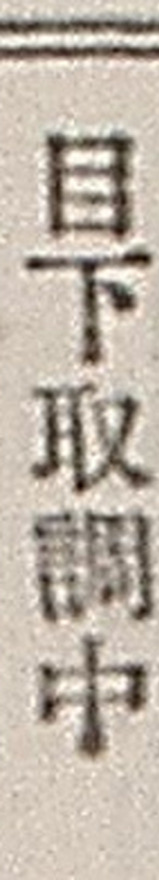目下取調中
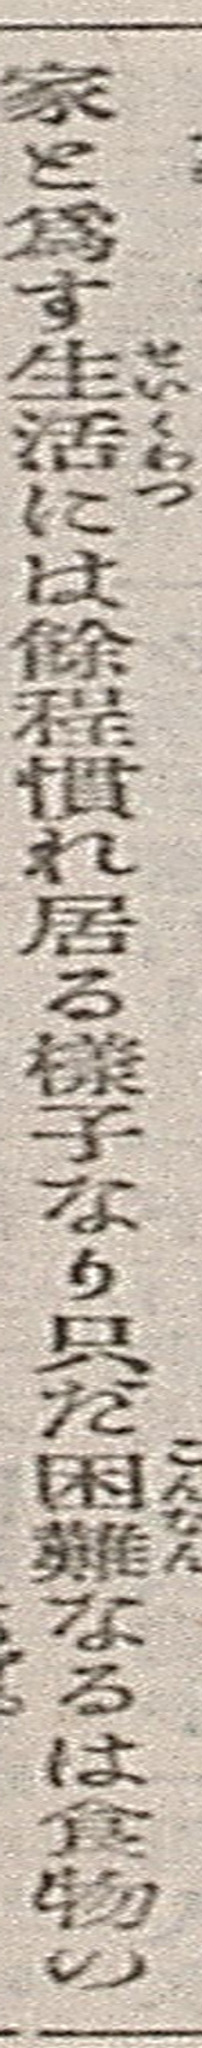家と為す生活には余程慣れ居る様子なり只だ困難なるは食物の
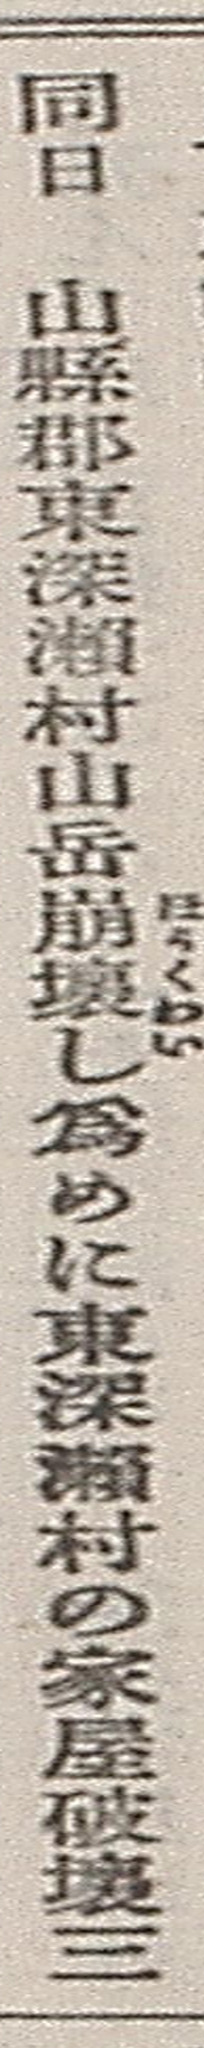同日山縣郡東深瀬村山岳崩壊し為めに東深瀬村の家屋破壊三
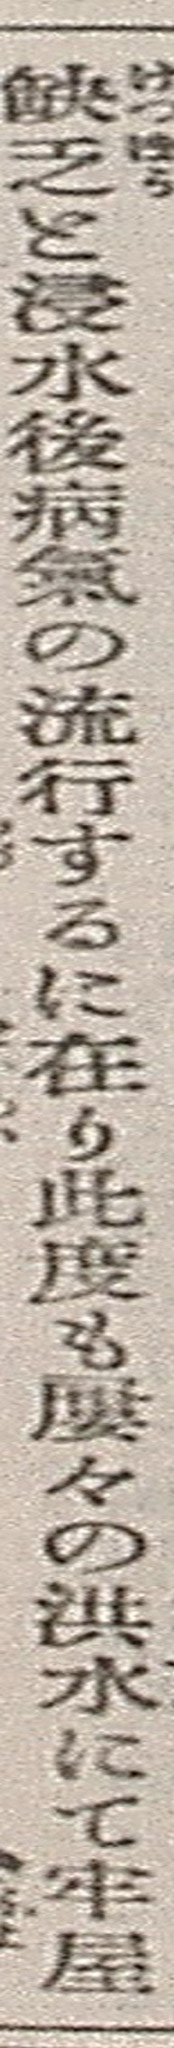缺亡と浸水後病気の流行するに在り此度も屡々の洪水にて牢屋
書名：風俗畫報臨時増刊第百二十六號　洪水被害録（中）
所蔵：東京大学地震研究所図書室 Earthquake Research Institute Library, The University of Tokyo, JAPAN
